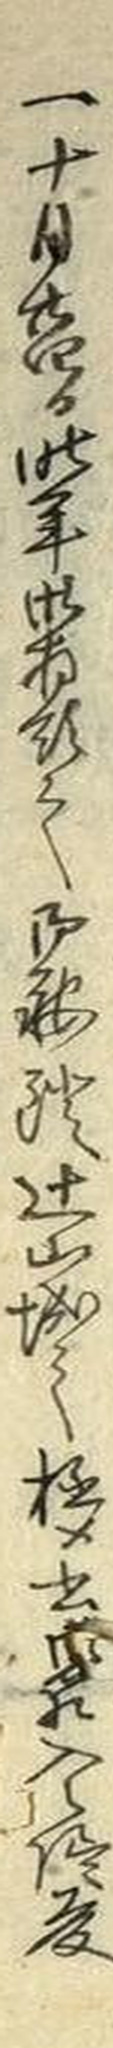一十月廿四日昨年御拝領之御鞍鐙辻山城之極メ書御箱入候侭藤
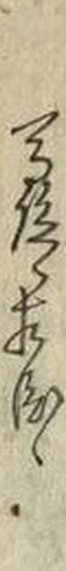馬殿へ相渡候
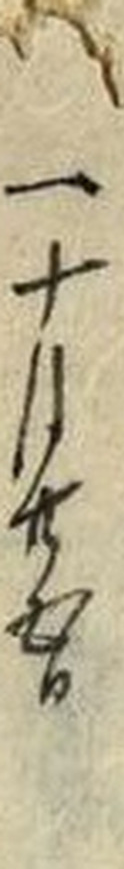一十月廿五日

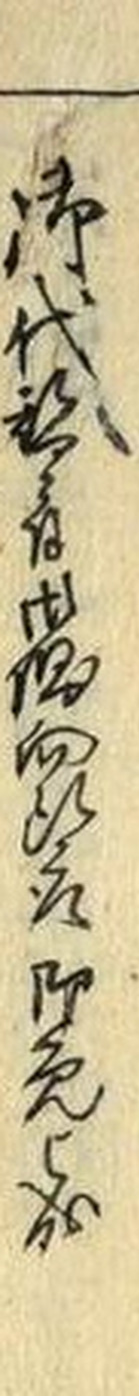御代替ニ付御側向頭取御免被成
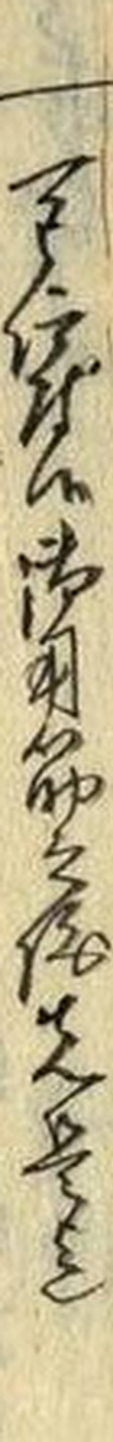可被仰付候御用筋之儀先是迄
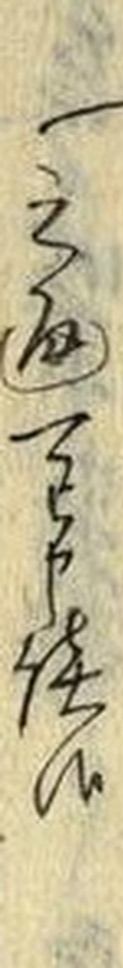之通可被申談候
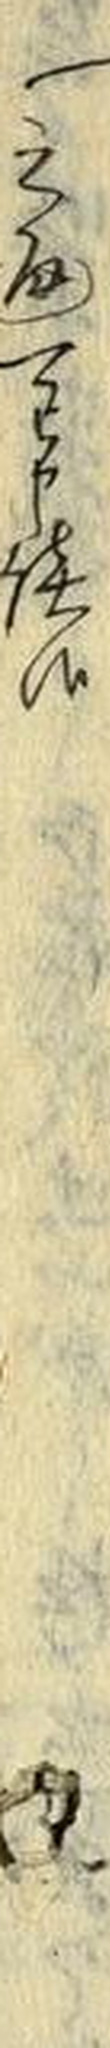之通可被申談候
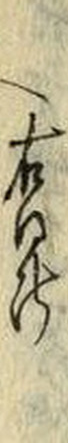右同断
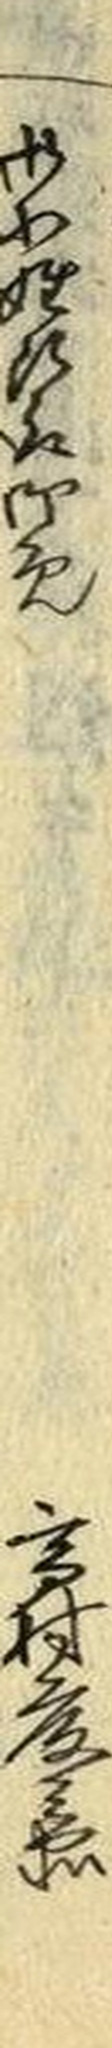御小姓頭取御免高村藤兵衛
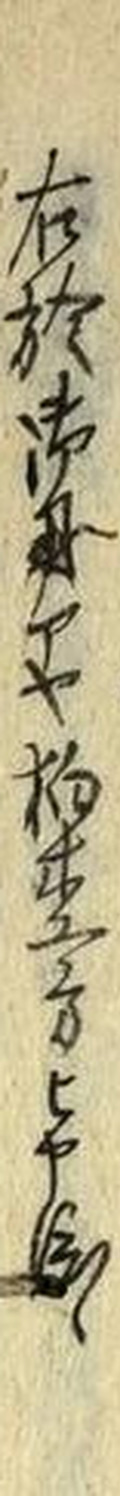右於御用部や狛杢方被申渡候
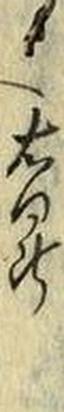右同断
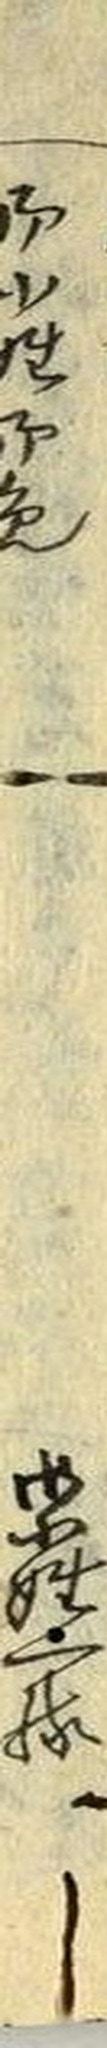御小姓御免御小姓一統
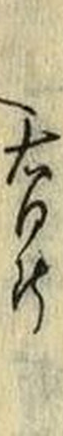右同断
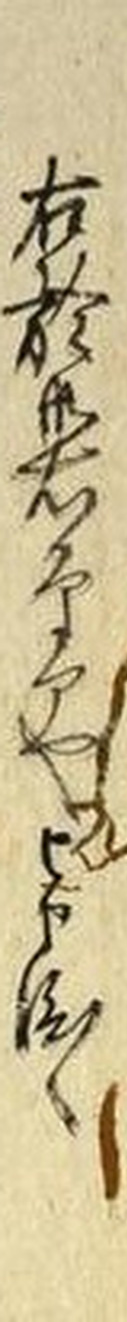右於御右筆部や被申渡候
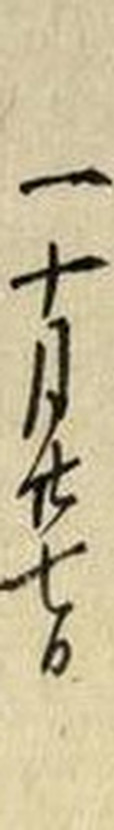一十月廿七日
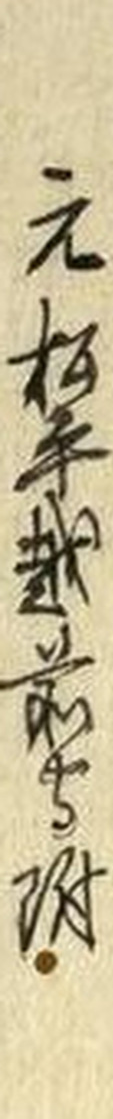元松平越前守附
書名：少傅日録抄（斉善付側向頭取日記、江戸并道中、初入在国、逝去後…
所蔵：福井県文書館 Fukui Prefectural Archives
